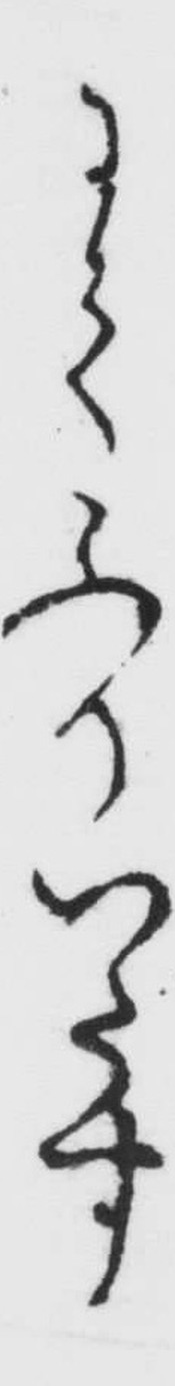にてふりいだす
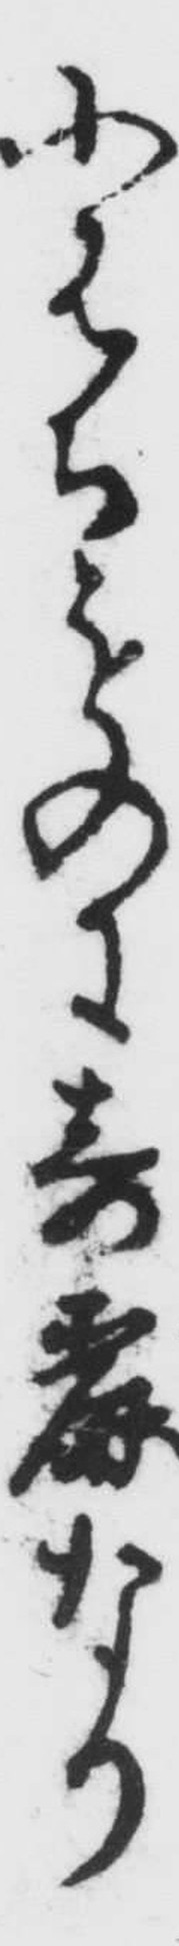小はちものに奇麗なり
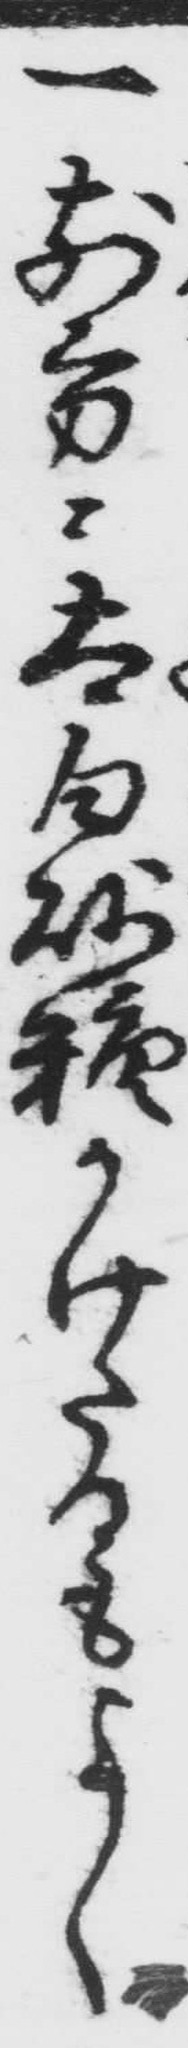一前方に太白砂糖かけたるもよし
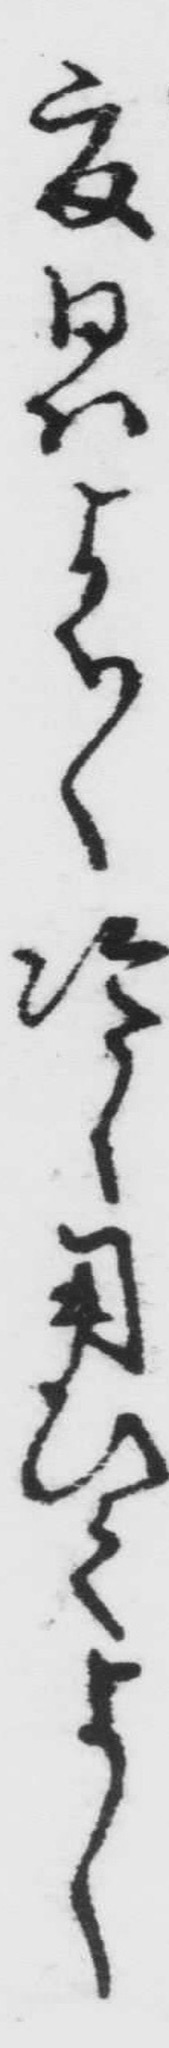夏日はよく〳〵冷し用ひてよし

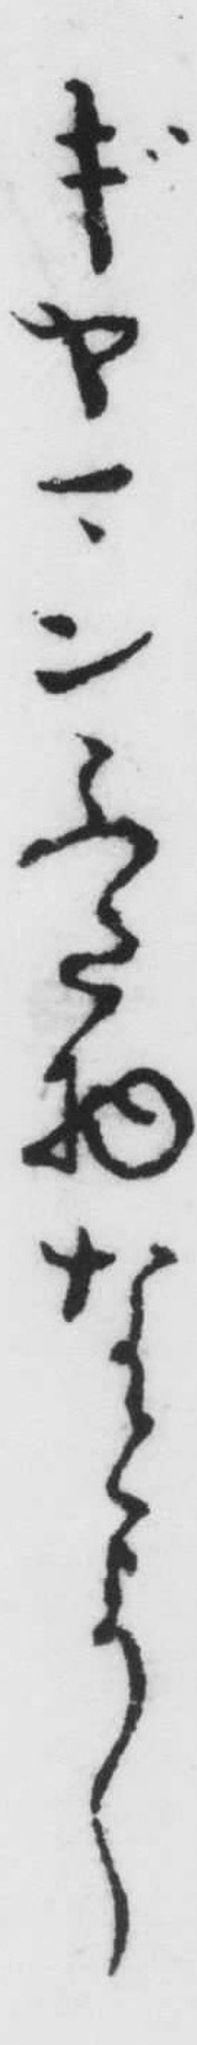ギヤマンふた物なとよし
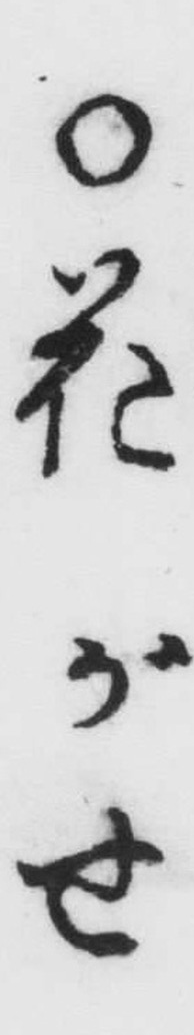○花がせ
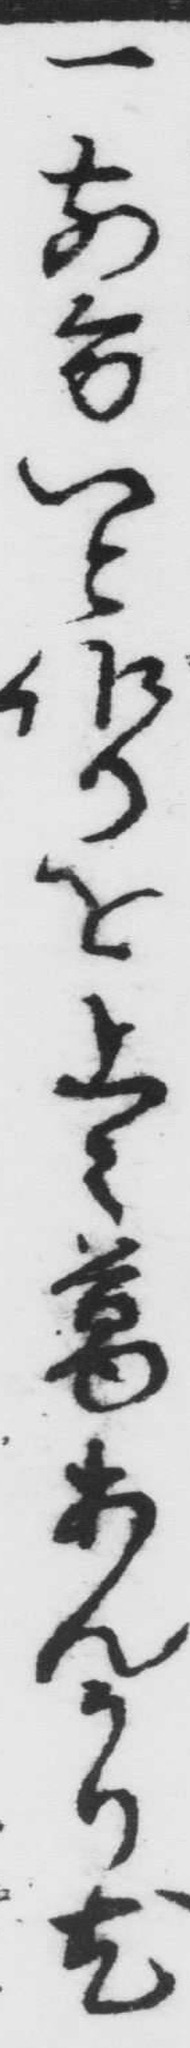一前方いと作りを上に葛あんうり尤
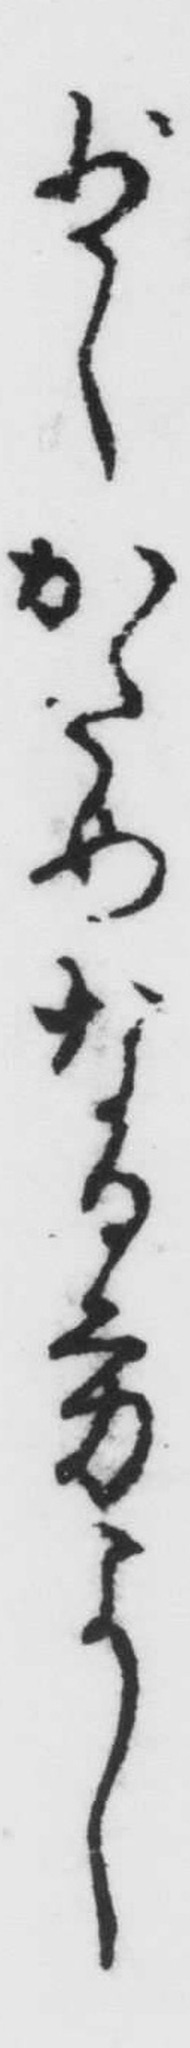少しかためなる方よし
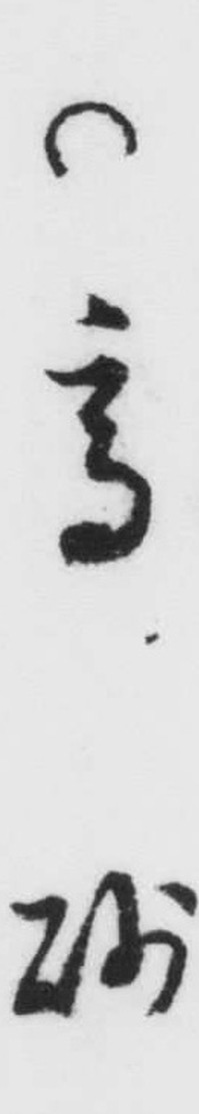○高砂
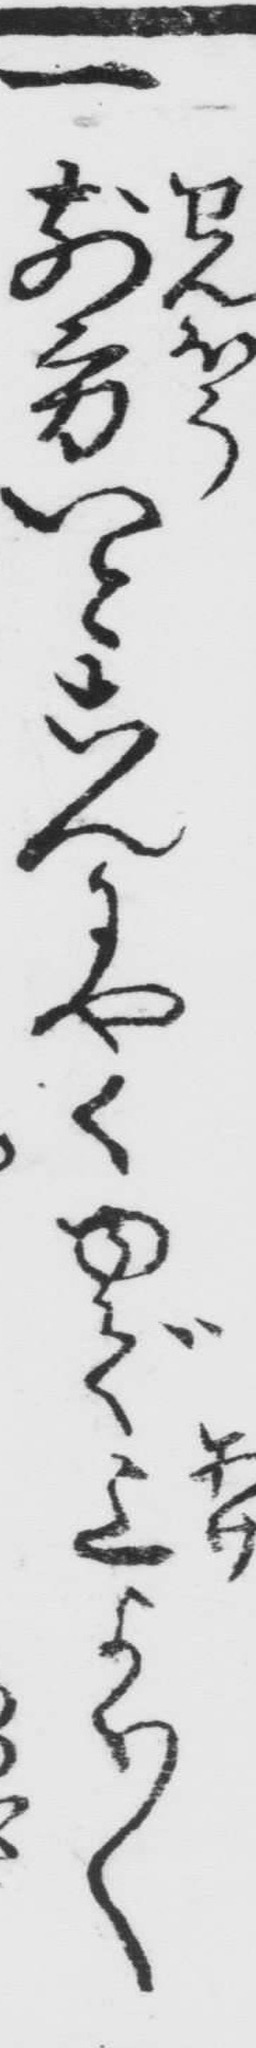一前方いとこんにやくゆで上よく〳〵
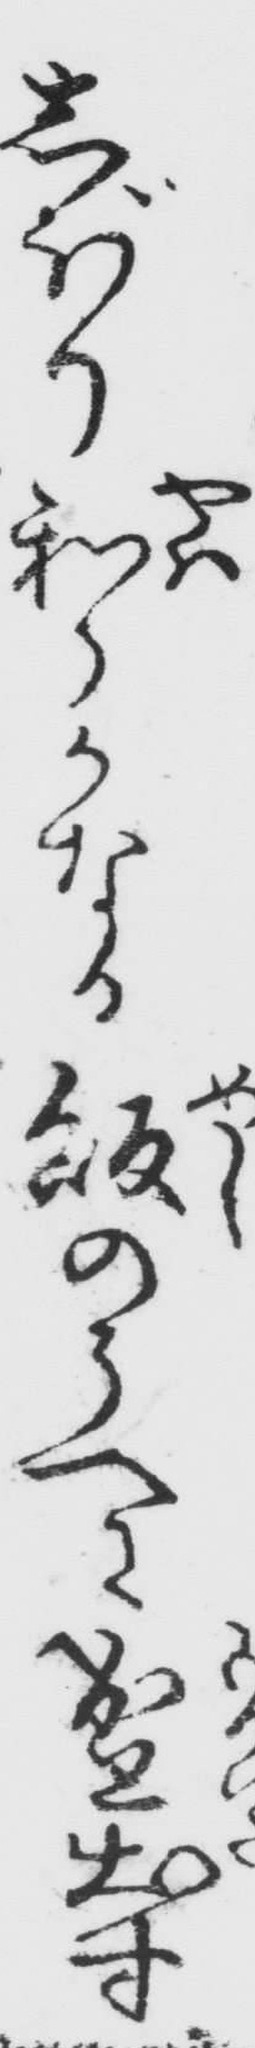しぼり和らかなる飯のうへに盛出す
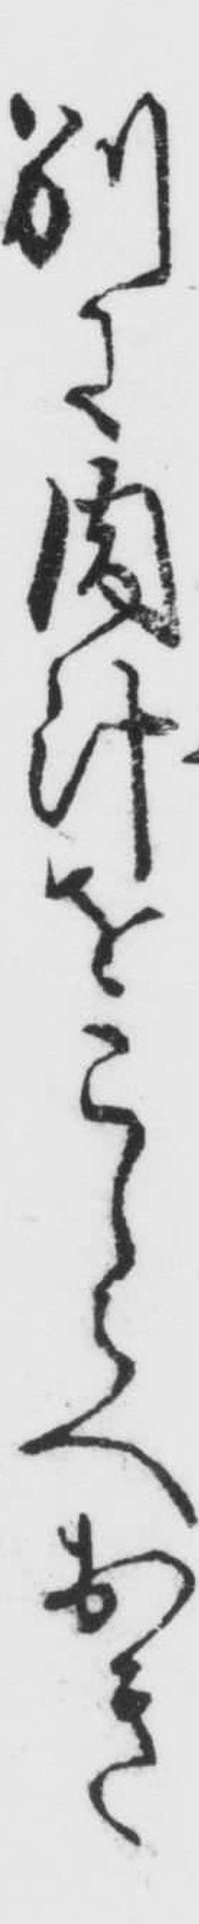別に肉汁をこしらへおき
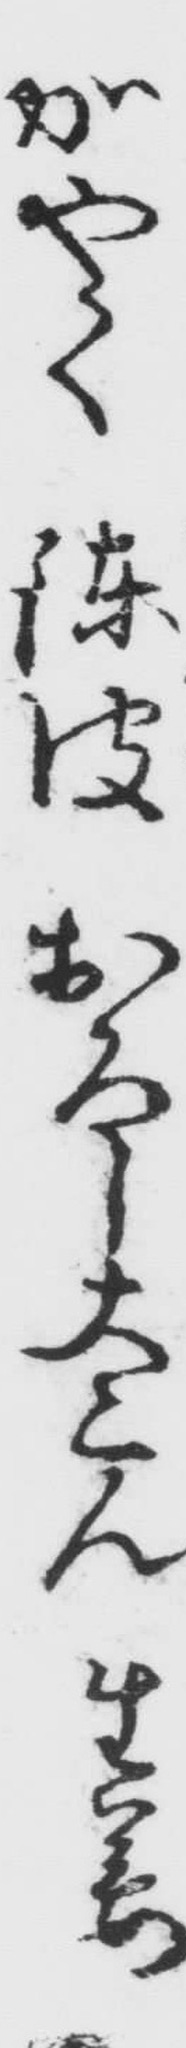かやく陳皮おろし大こん生姜
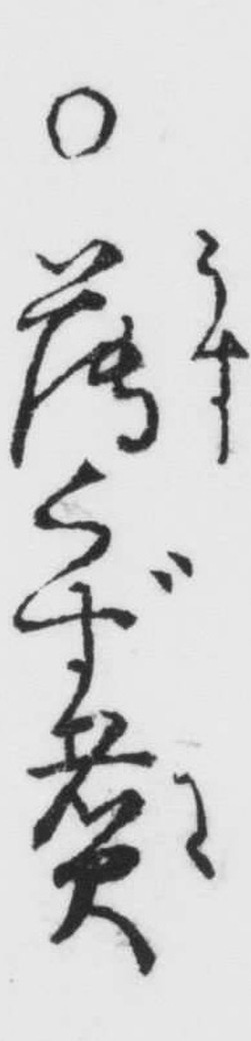○薄くず煮
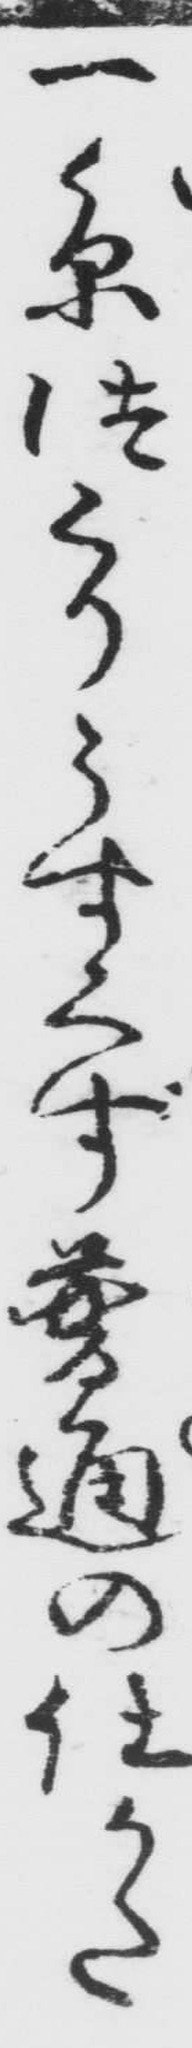一糸つくりうすくず普通の仕かた

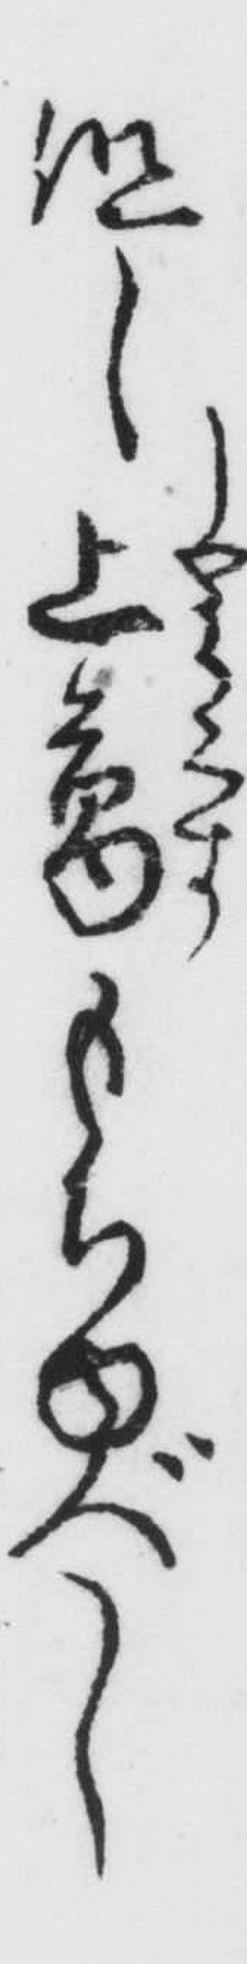但し上葛もちゆべし
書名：蒟蒻百珍
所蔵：大阪府立大学学術情報センター 国文学研究資料館
